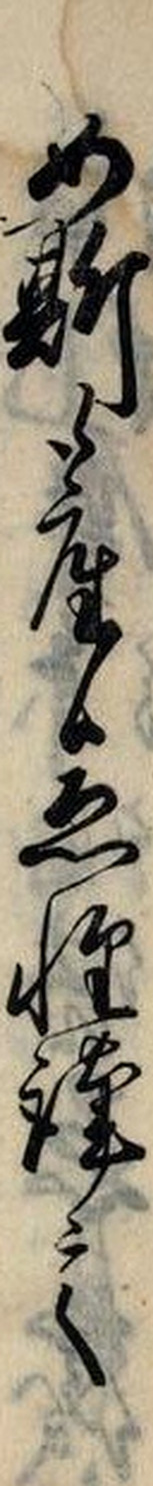如斯御座候恐惶謹言
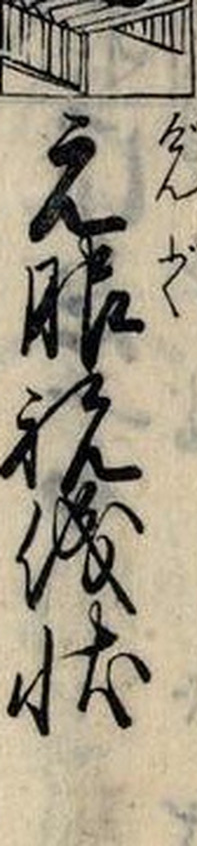元服祝儀状
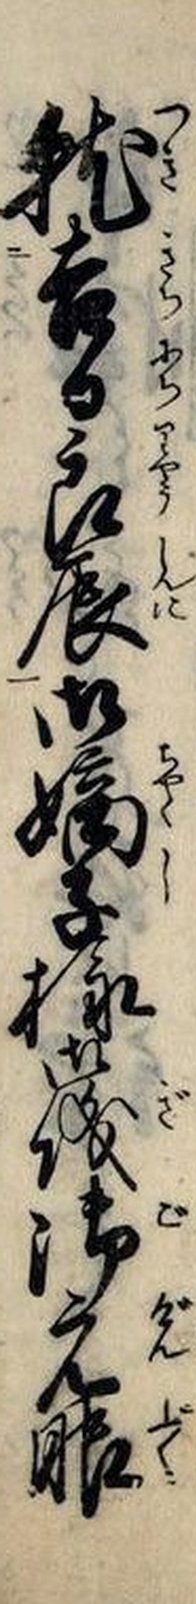就吉日良辰御嫡子様御儀御元服
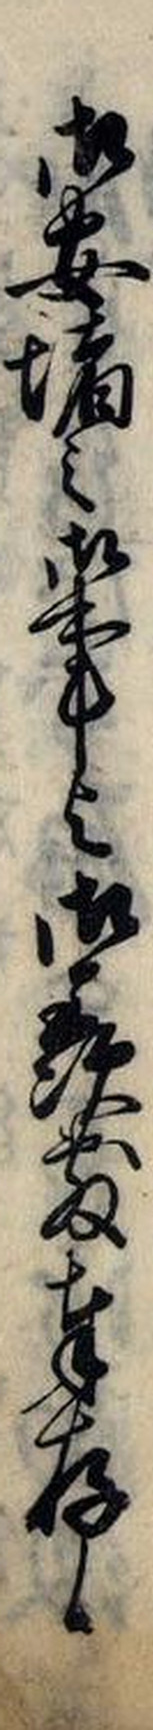御安堵之御事与御羨敷奉存候

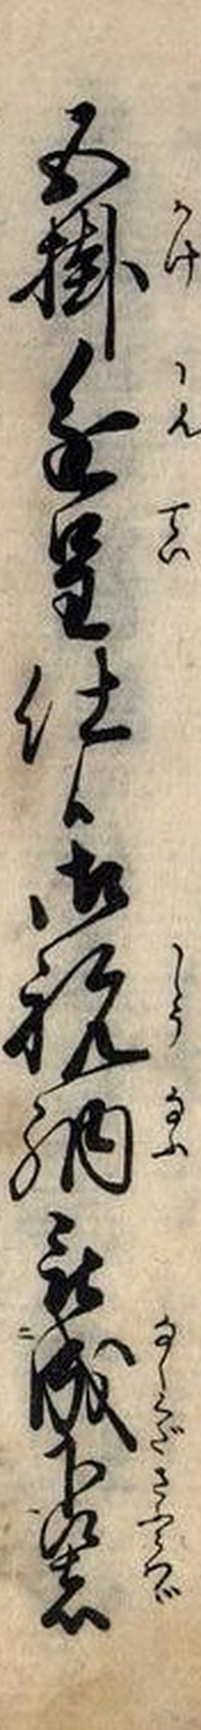五掛進呈仕候御祝納被成下候者
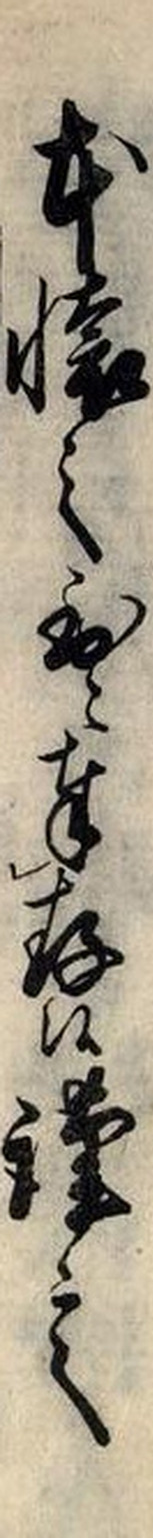本懐之至に奉存候謹言
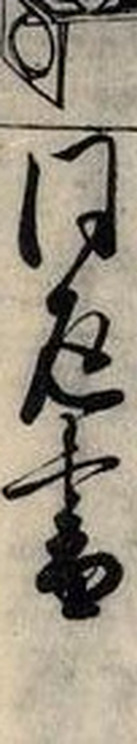同返書
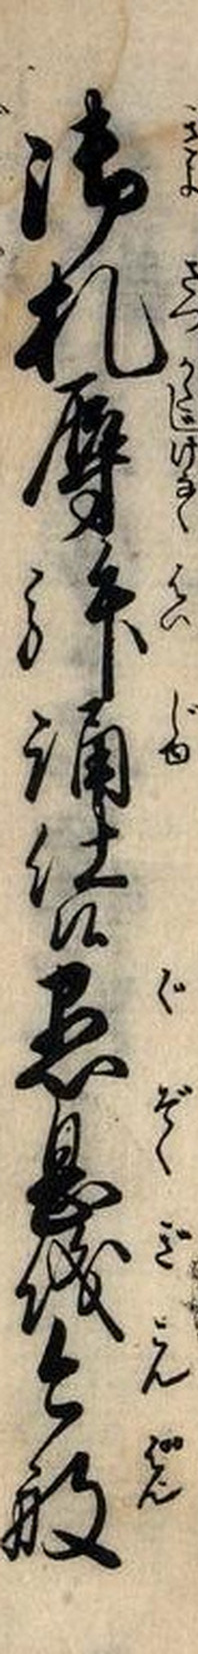御札辱拝誦仕候愚息儀今般
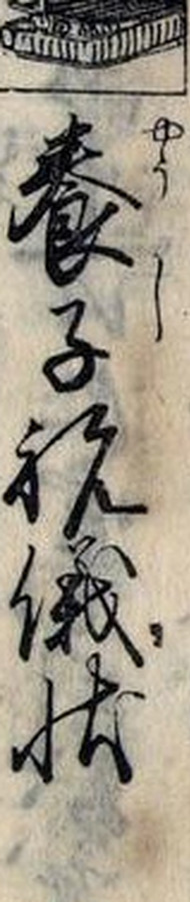養子祝儀状

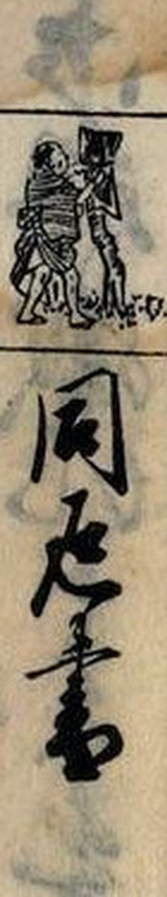同返書
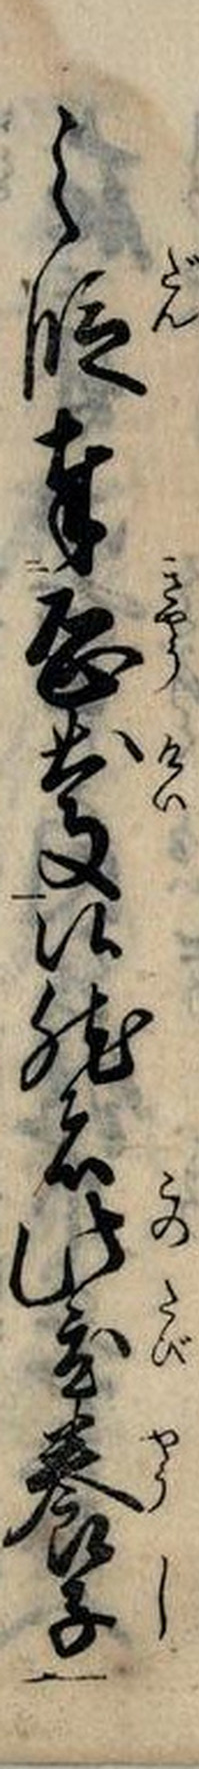之段奉恐慶候然者此度養子

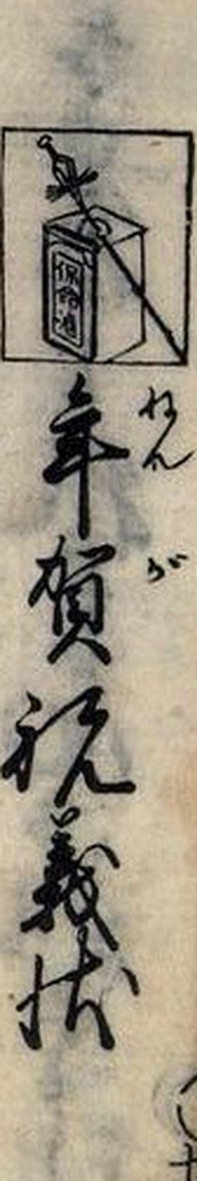年賀祝義状
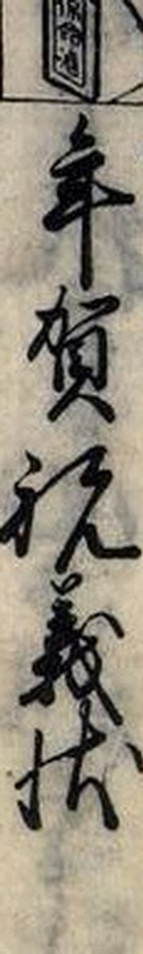年賀祝義状
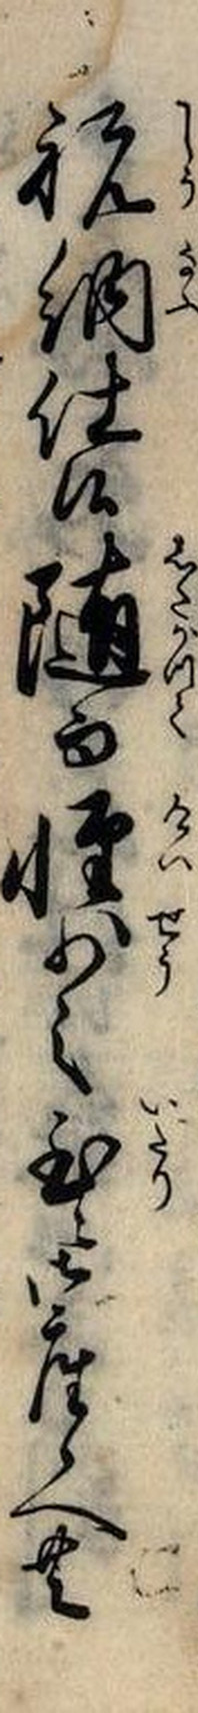祝納仕候随而軽少之至に御座候ヘ共
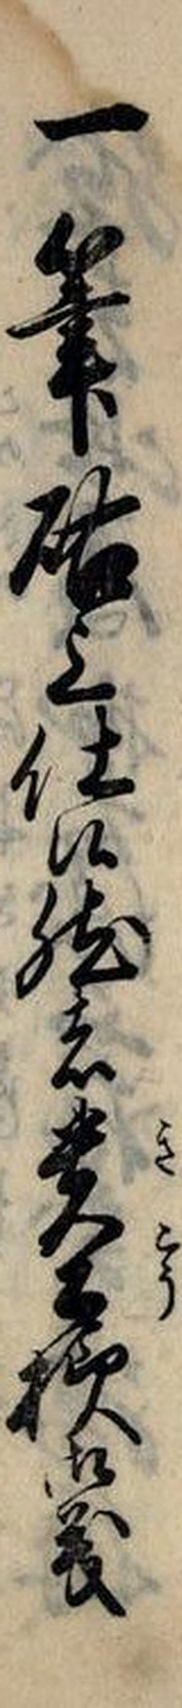一筆啓上仕候然者貴公様御義

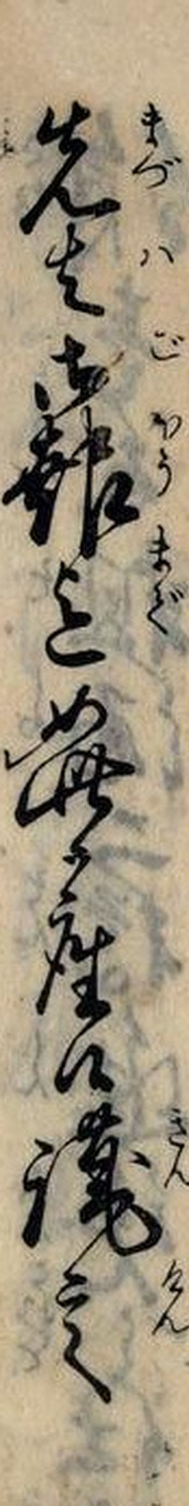先者御報迄如此御座候謹言
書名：大成用文章（往来物）
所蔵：福井県文書館 Fukui Prefectural Archives
